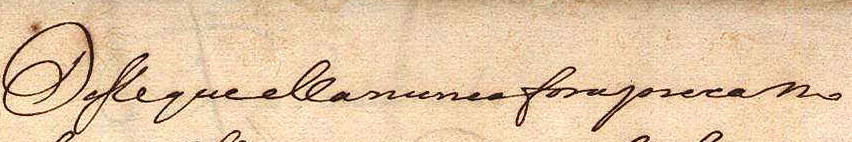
Disse que ella nunca fora preza no
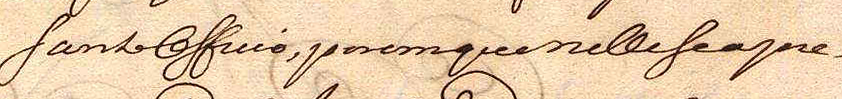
santo Officio, porem que nelle se apre
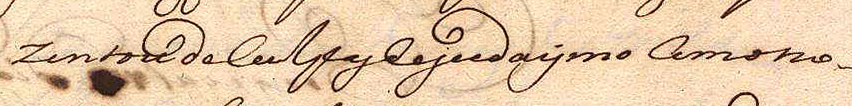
zentou de Culpas de judaismo Com o no
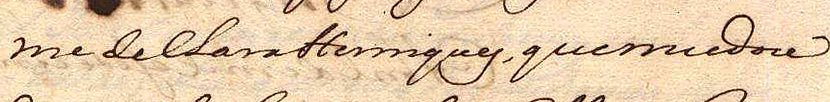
me de Clara Henriques, que mudou
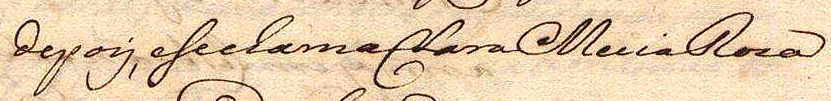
depois, e se chama CLara Mecia Roza
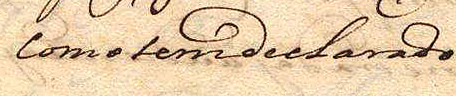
como tem declarado
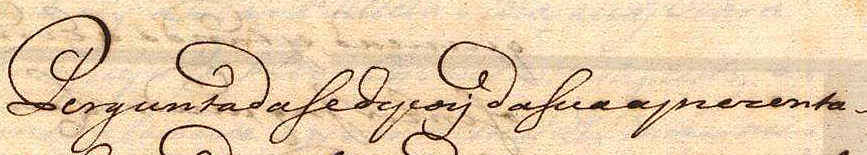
Perguntada se depois da sua aprezenta
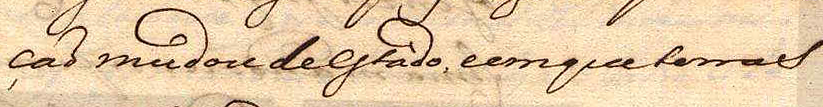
çaõ mudou de estado, e em que terras
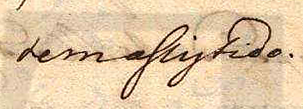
tem assistido.
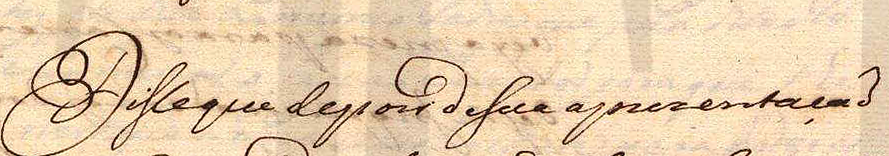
Disse que depois de sua aprezentaçaõ
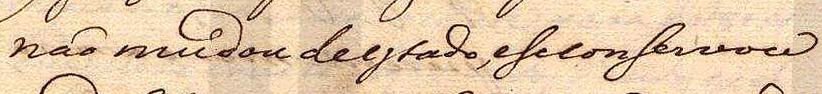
naõ mudou de estado, e se conservou
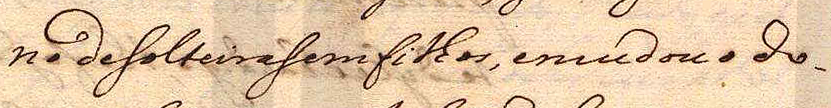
no de solteira sem filhos, e mudou o do
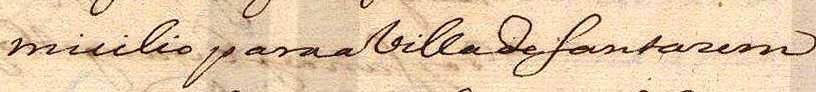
micilio para a villa de santarem
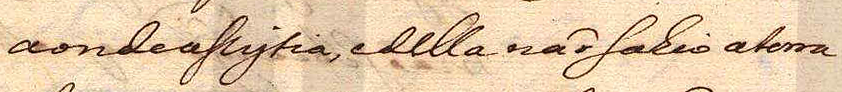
aonde assistia, e della naõ sahio a terra
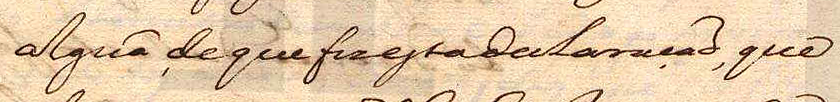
alguā de que fiz esta decLaraçaõ, que
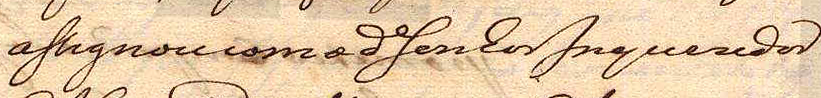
assignou com o d.o senhor Jnquezidor
